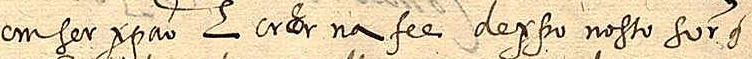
em ser xpaõ E creer na fee de xpo nosso sor̄ q̄
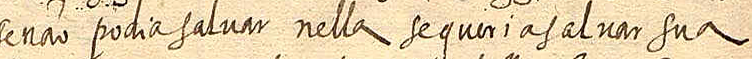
se não podia saluar nella se queria saluar sua
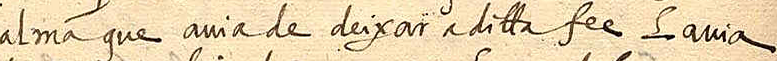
alma que auia de deixar a ditta fee E auia
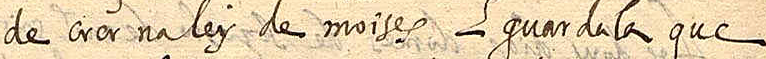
de crer na ley de moises E guardala que
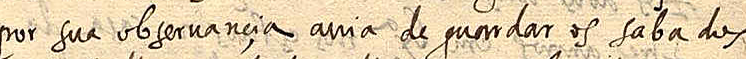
por sua obseruançia auia de guardar os sabados
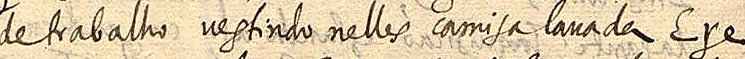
de trabalho uestindo nelles camisa lauada E ye
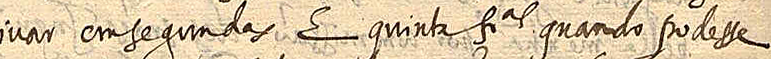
iuar em segundas E quinta fras quando podesse
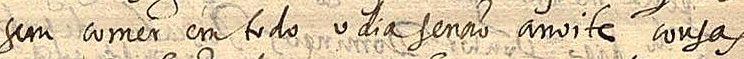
sem comer em todo o dia senão a noite cousas
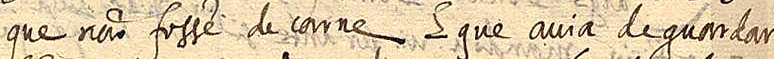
que não fossē de carne E que auia de guardar
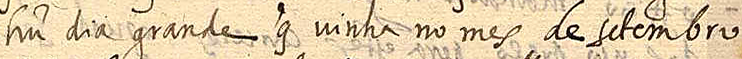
hū dia grande q̄ uinha no mes de setembro
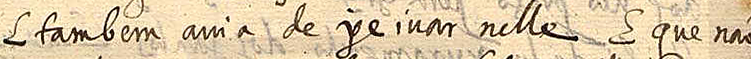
E tambem auia de yeiuar nelle E que naõ
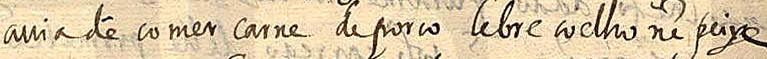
auia de comer carne de porco lebre coelho nē peixe
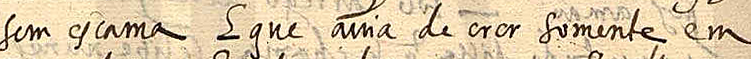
sem escama E que auia de crer somente em
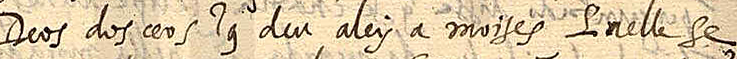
Deos dos ceos q̄ deu a ley a moises E nelle se
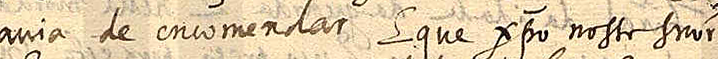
auia de encomendar E que xp̄o nosso senor̄
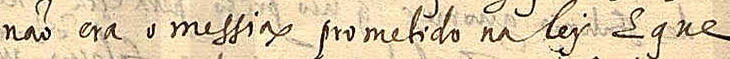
naõ era o messias prometido na ley E que
